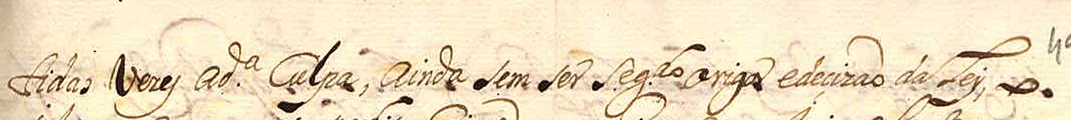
tidas Vezes a d.a Culpa, ainda sem ser seg.do o rigor e decizaõ da Ley; x.
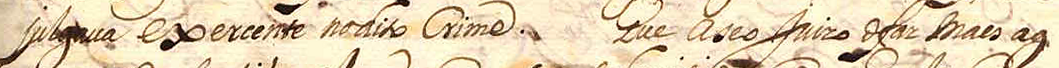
julgaua exercente no dito Crime. Que a seo Juizo o faz maes ag
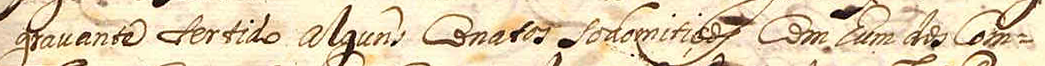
grauante ter tido algun̄s Conatos sodomiticos Com hum dos Com
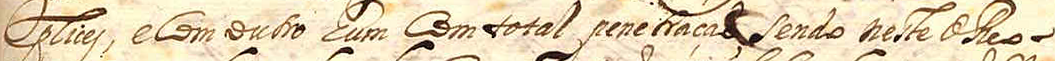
plices, e Com outro hum Com total penetraçaõ sendo neste o Reo
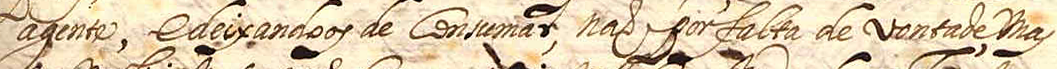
agente, e deixandoos de Consumar naõ por falta de vontade, Mas
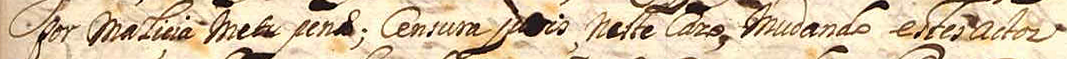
por malicia mete pena; Censura pois neste Cazo, mudando estes actoz
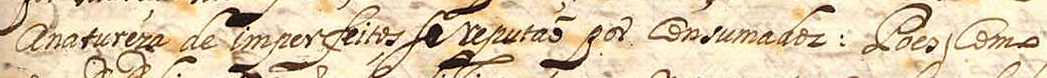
a natureza de imperfeitos, se reputaõ por Consumadoz: Poes Como
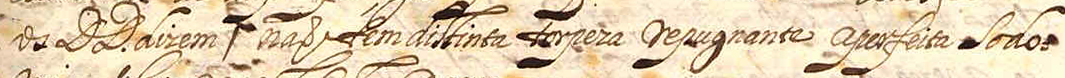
os DD. dizem naõ tem distinta torpeza repugnante a perfeita sodo
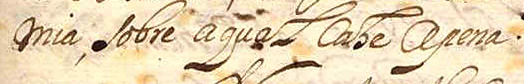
mia, sobre a qual cabe A pena.
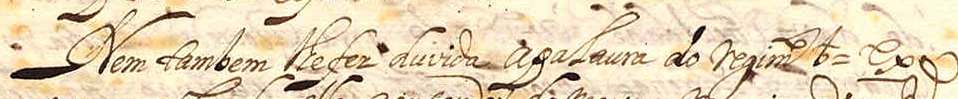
Nem tambem lhe fez duvida a palaura do regimto b̄ = Ex
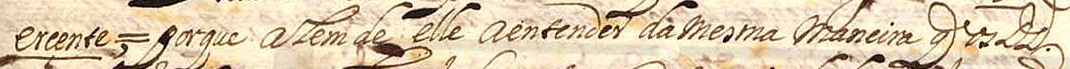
ercente, = porque alem de elle a entender da mesma Maneira q̄ os DD.
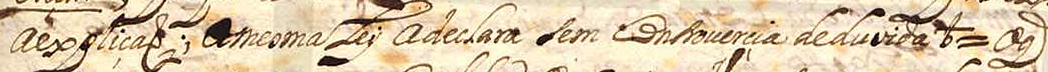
a expliçaõ; a mesma Ley a declara sem Controuercia de duvida b̄ = o q̄
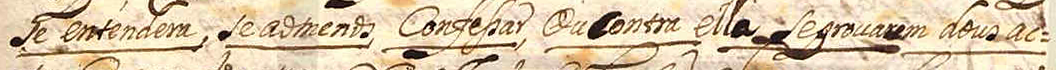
se entendera, se ao menos, Confessar Ou contra ella se prouarem dous ac
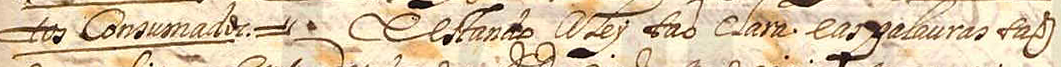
tos Consumados. = E estando a Ley taõ clara e as palauras taõ
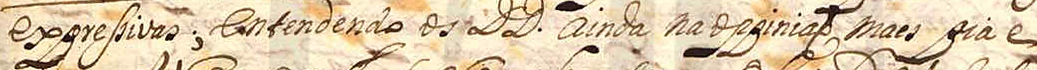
expressivas; Entendendo os DD. ainda na oppiniaõ maes pia e
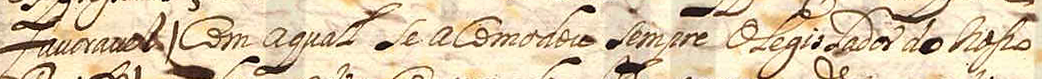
fauorauel (Com a qual se acomodou sempre e Legislador do nosso
